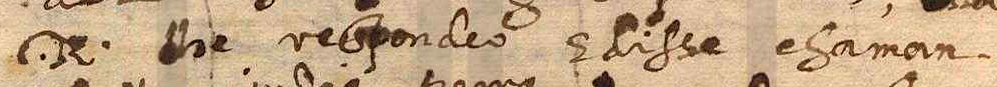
.R. lhe respondeo E disse chaman
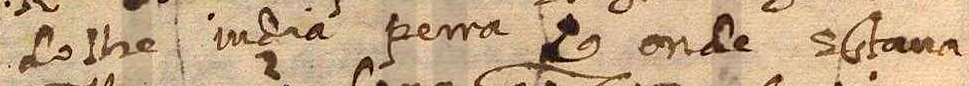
dolhe iudia perra q̄ onde Estaua
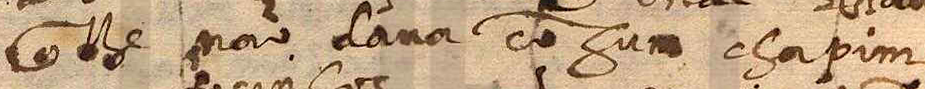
q̄ lhe naõ daua c̄o hum chapim
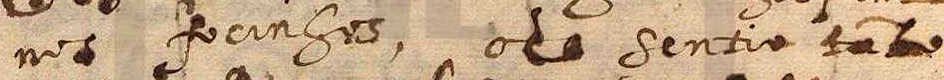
nos focinhos, o ho sentio tāto
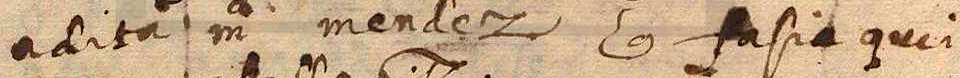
a dita ma mendez q̄ fasia quei
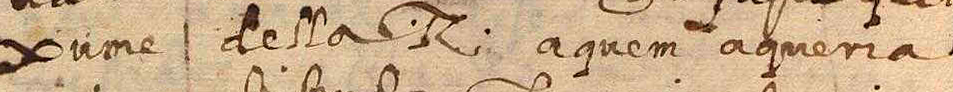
xume della .R. a quem a queria
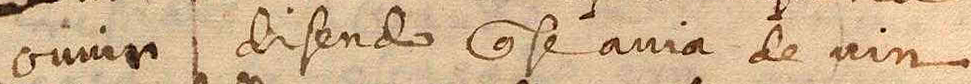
ouuir disendo q̄ se auia de uin
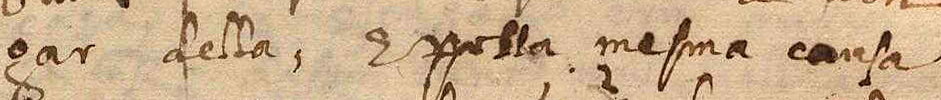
gar della, E polla mesma causa
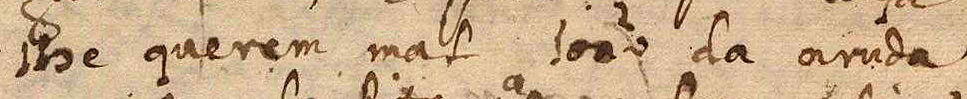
lhe querem mal Ioaõ da aruda
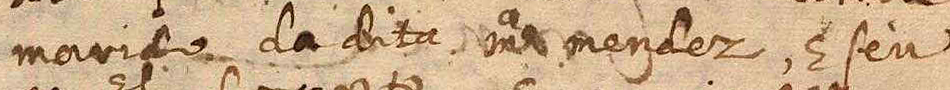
marido da dita ma mendez, E seu
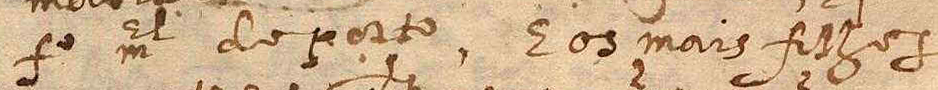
fo mEl do porto, E os mais filhos
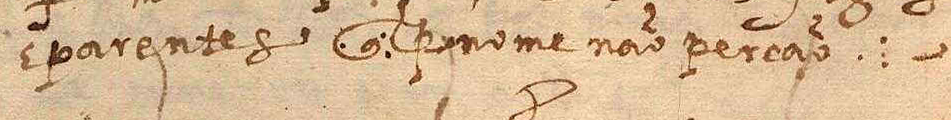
E parentes q̄ p̄ nome naõ percaõ
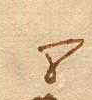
8
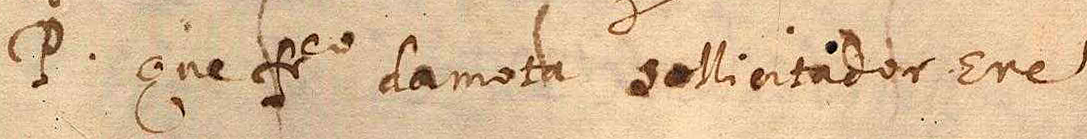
P. que frco da mota sollicitador E re
